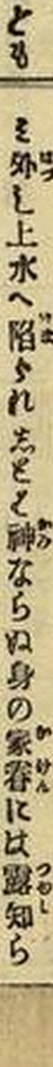み外し上水へ陥られしとは神ならぬ身の家眷には露知ら
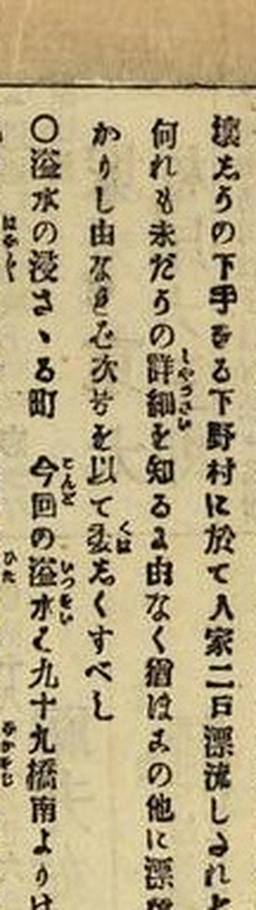かりし由なれば次号を以て委しくすべし
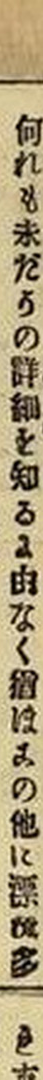何れも未だかの詳細を知るに由なく猶ほこの他に漂流多
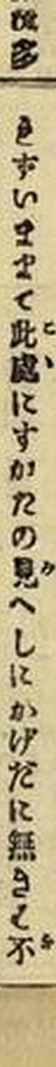れずいままて此處にすがたの見へしにかげだに無きは不
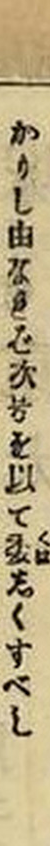かりし由なれば次号を以て委しくすべし
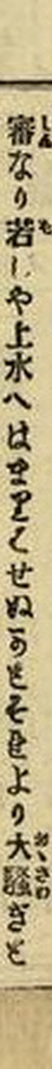審なり若しや上水へはまりはせぬかとそれより大騒ぎと
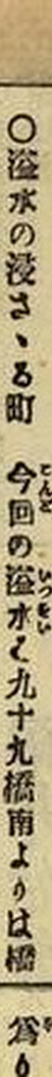○溢水の浸さゝる町今回の溢水は九十九橋南よりは橋
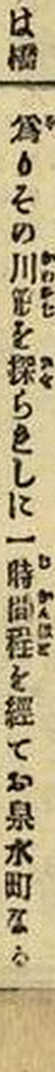爲りその川筋を探られしに一時間程を經てお泉水町なる
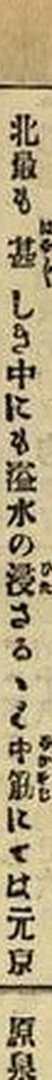北もっとも甚しき中にも溢水の浸さるゝは中筋にては元京
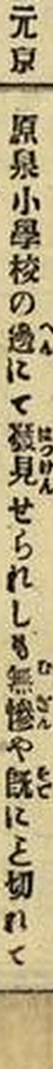原泉小學校の邊にて發見せられしも無慘や既にこと切れて
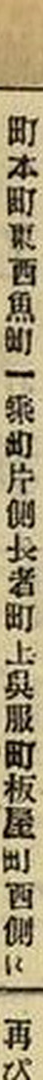町本町東西魚町一乗町片側長者町上呉服町板屋町西側に
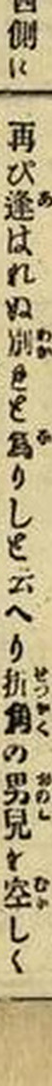再び逢はれぬ別れと爲りしと云へり折角の男兒を空しく
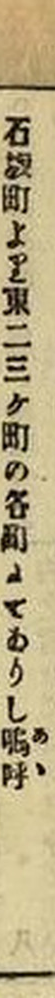石坂町より東二三ヶ町の各町にてありし嗚呼
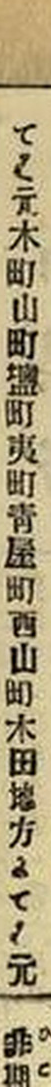ては元木町山町𪉩町夷町靑屋町西山町木田地方にては元
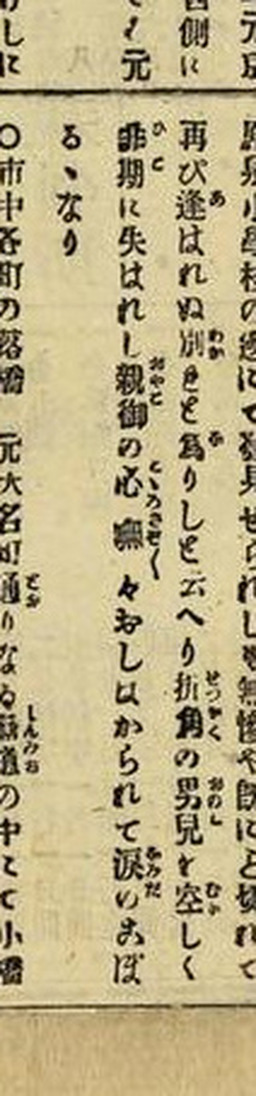非期に失はれし親御の心嘸々おしはかられて涙のこぼ
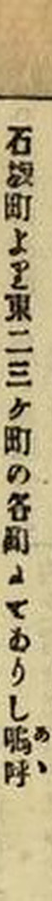石坂町より東二三ヶ町の各町にてありし嗚呼
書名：温古集 五巻
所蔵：福井県文書館 Fukui Prefectural Archives
